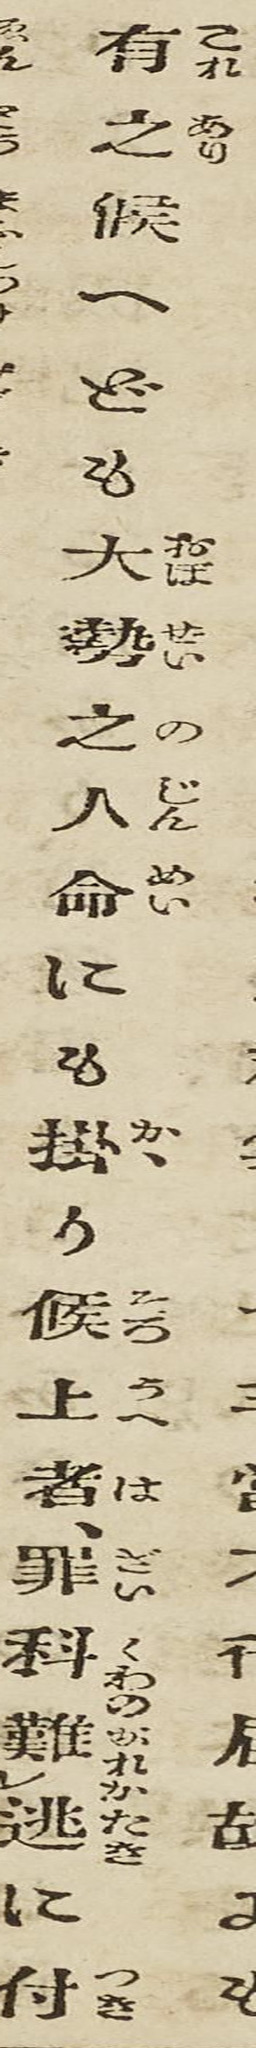有之候へども大勢之人命にも掛り候上者、罪科難逃に付
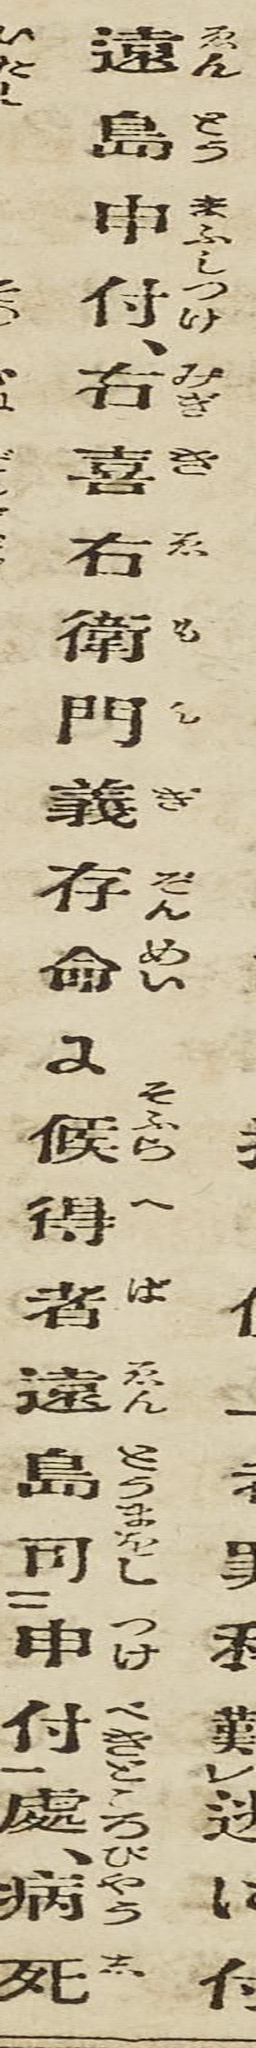遠島申付、右喜右衛門義存命に候得者遠島可申付処、病死
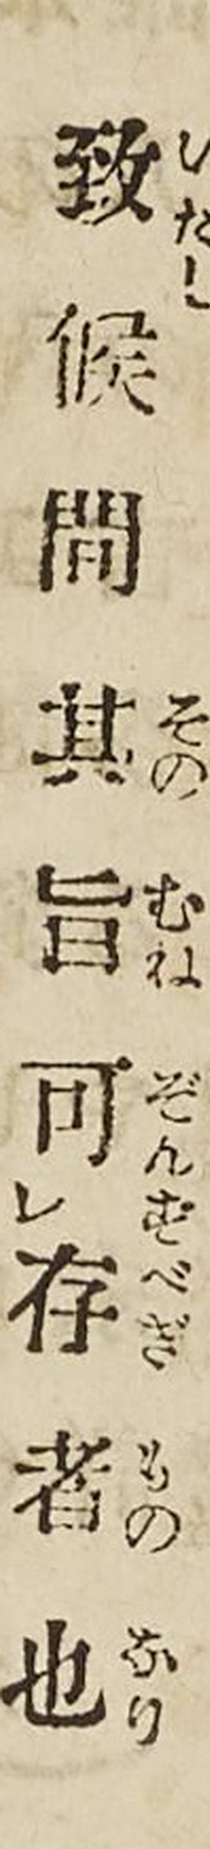致候間其旨可存者也
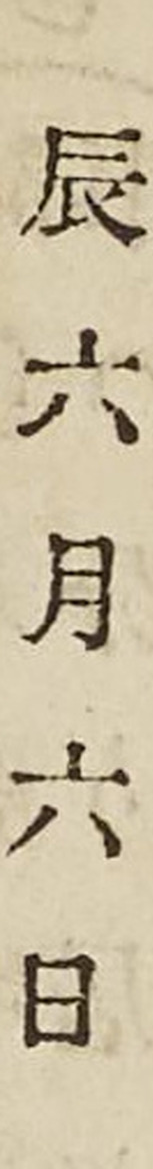辰六月六日
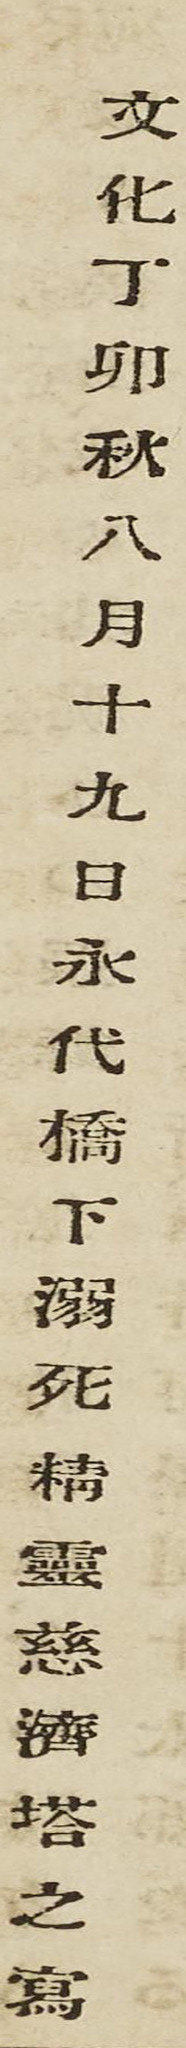文化丁卯秋八月十九日永代橋下溺死精霊慈済塔之写
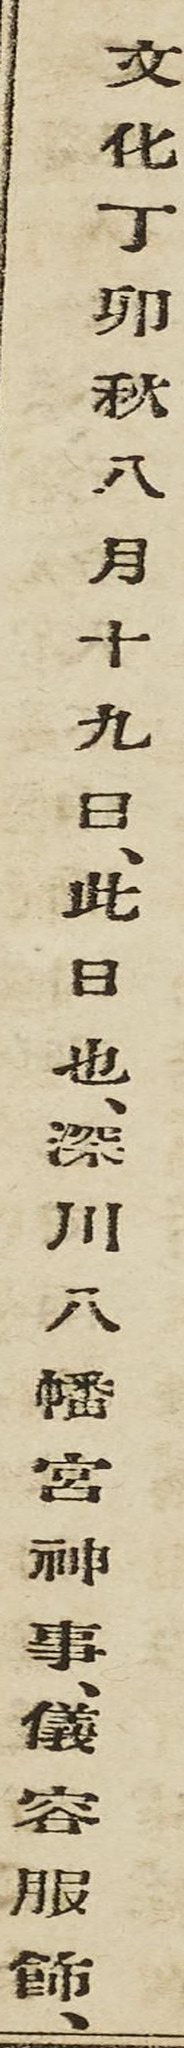文化丁卯秋八月十九日、此日也、深川八幡宮神事、儀容服飾、
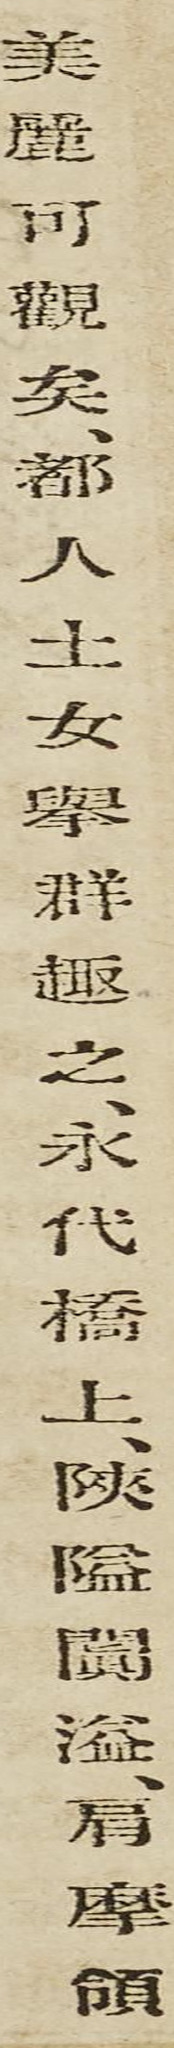美麗可観矣、都人土女挙群趣之、永代橋上、陜隘闐溢󠄀、肩摩領
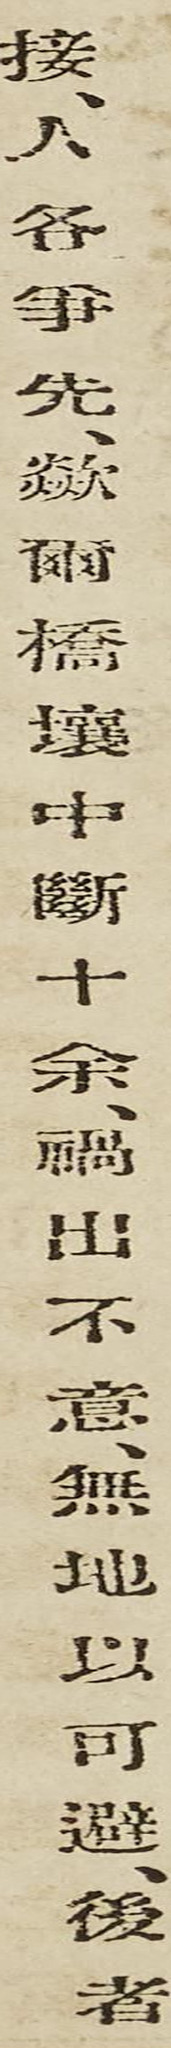接、人各争先、歘尓橋壌中断十余、禍出不意、無地以可避、後者
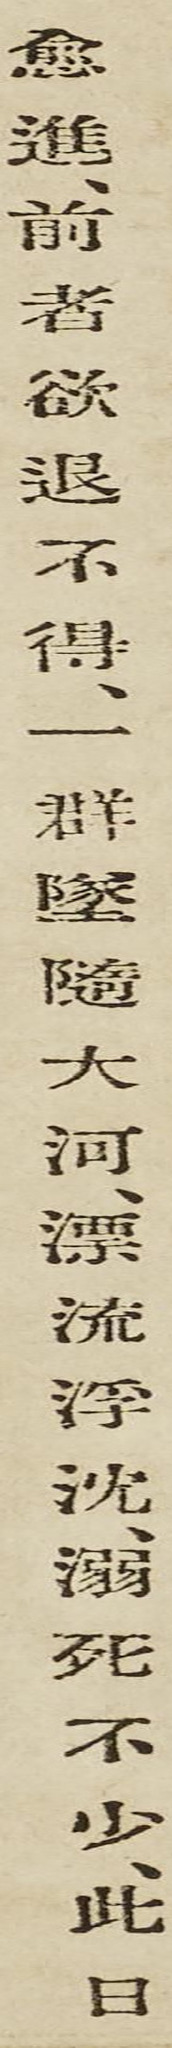愈進、前者欲退不得、一群墜随大河、漂流浮沈、溺死不少、此日
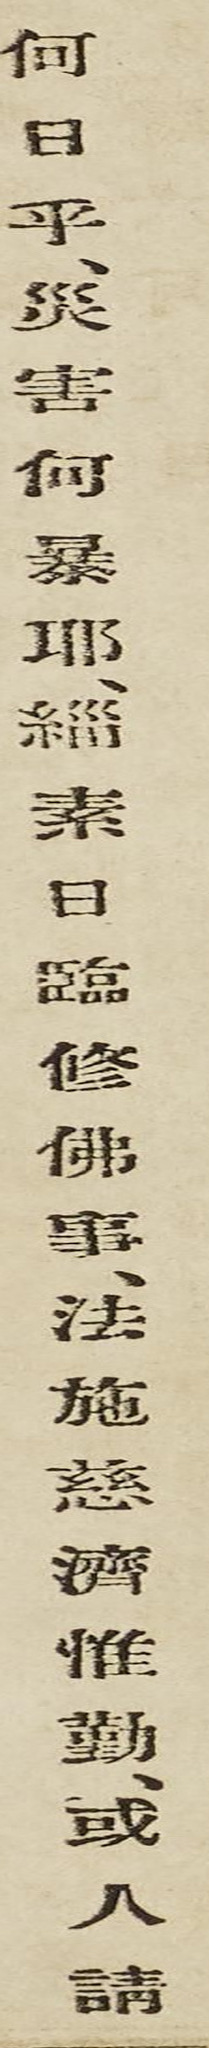何日乎、災害何暴耶、緇素日臨修仏事、法施慈済惟勤、或人請
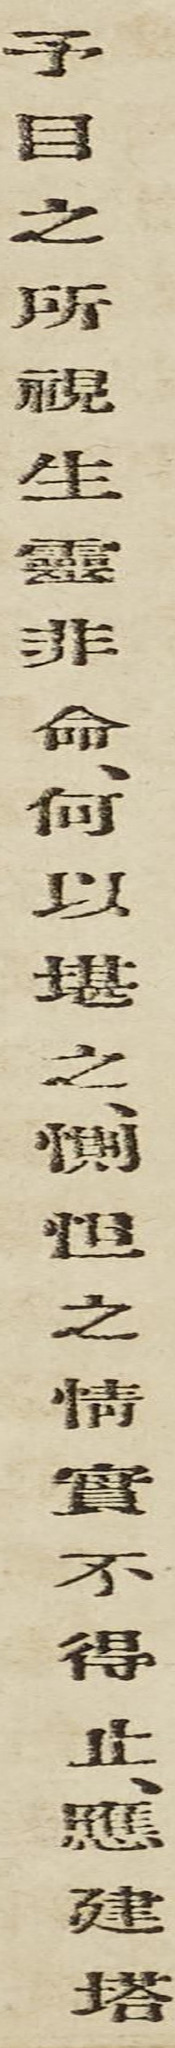予目之所視生霊非命、何以堪之、惻怛之情実不得止、応建塔
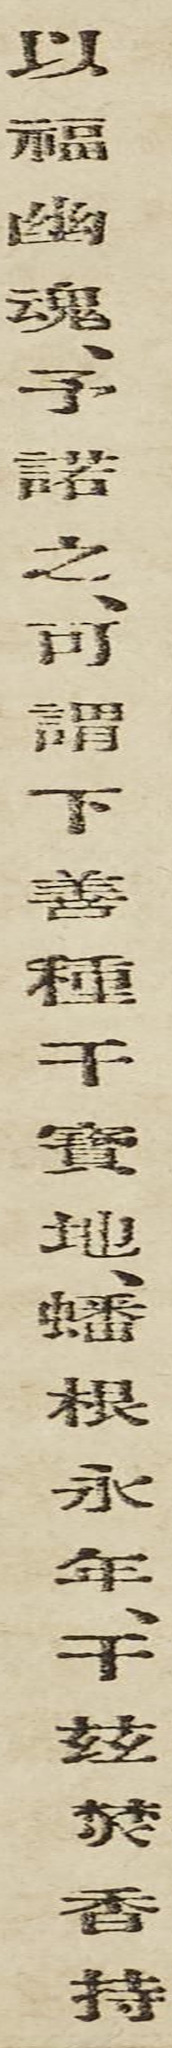以福幽魂、予諾之、可謂下善種干宝地、蟠根永年、干茲焚香持
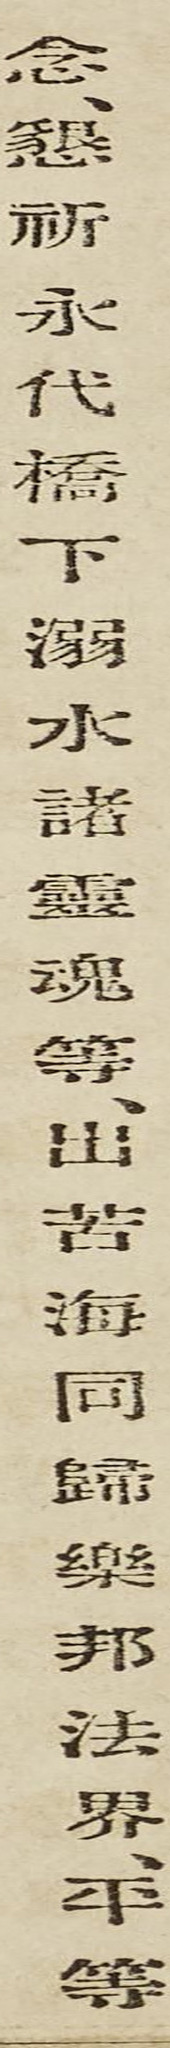念、懇祈永代橋下溺水諸霊魂等、出苦海同帰楽邦法界、平等
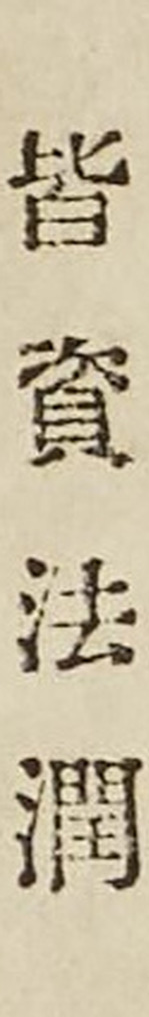皆資法潤
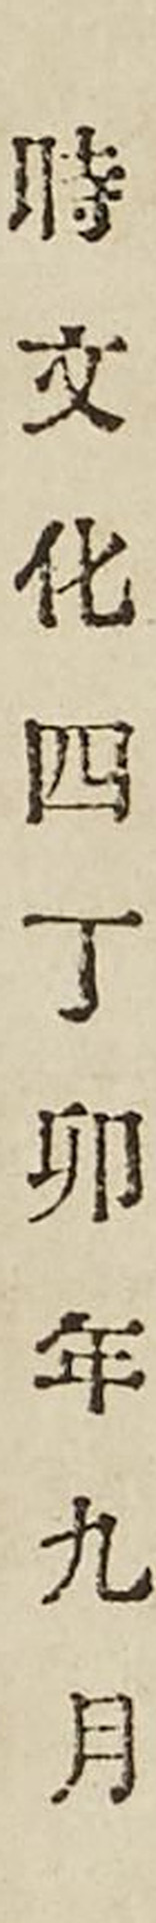時文化四丁卯年九月
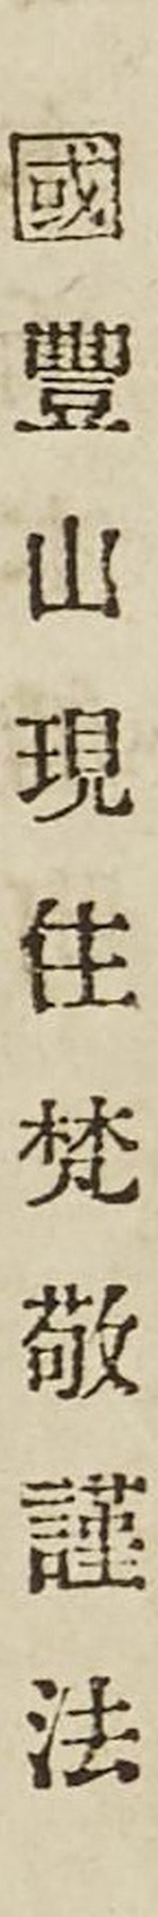国豊山現住焚敬謹法
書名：永代惨話　文化の夢　全
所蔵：東京大学地震研究所図書室 Earthquake Research Institute Library, The University of Tokyo, JAPAN
